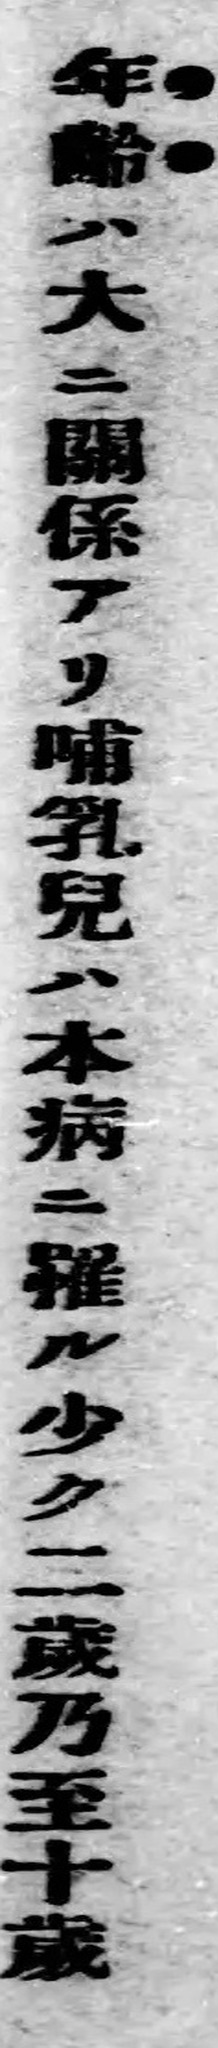年齡ハ大ニ關係アリ哺乳兒ハ本病ニ罹ル少ク二歳乃至十歳
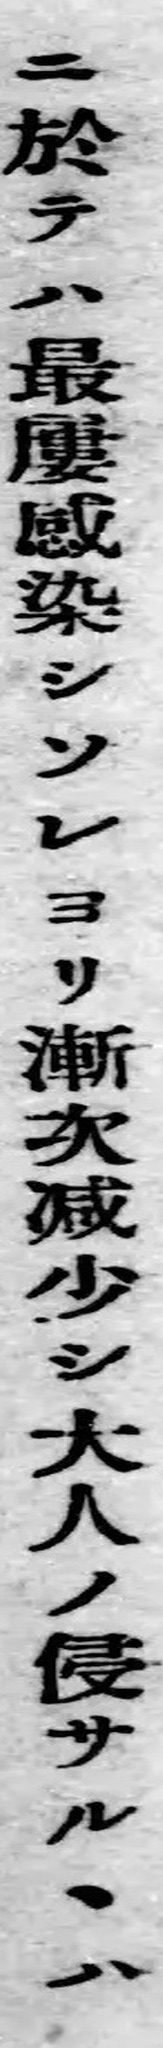ニ於テハ最屢感染シソレヨリ漸次減少シ大人ノ侵サルヽハ
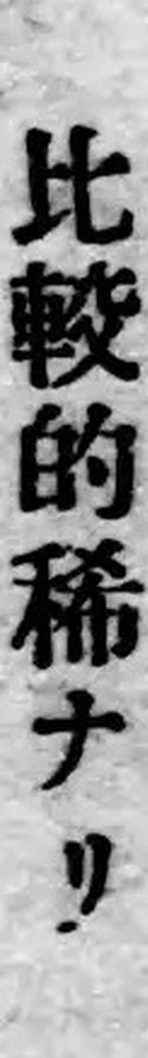比較的稀ナリ
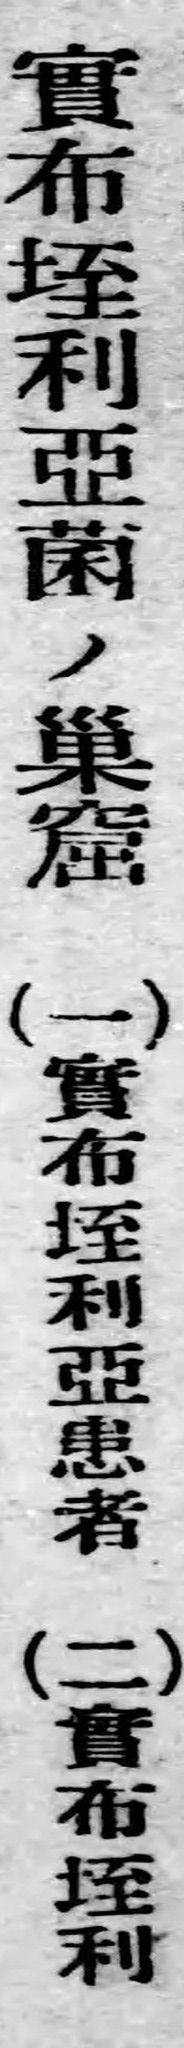實布垤利亞菌ノ巢窟(一)實布垤利亞患者(二)實布垤利
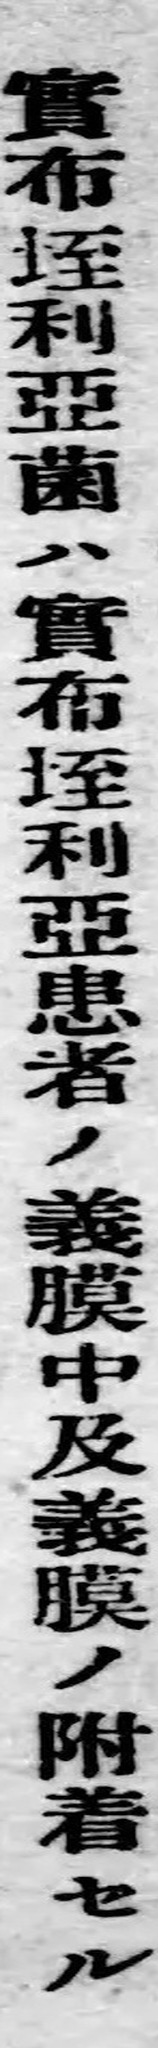實布垤利亞菌ハ實布垤利亞患者ノ義膜中及義膜ノ附着セル
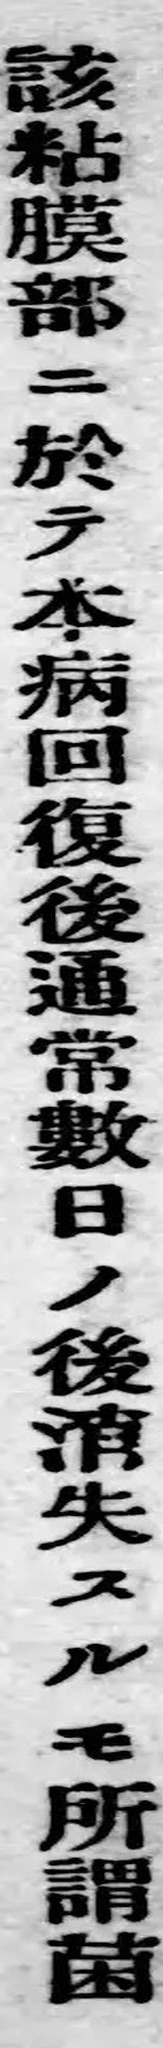該粘膜部ニ於テ本病回復後通常數日ノ後消失スルモ所謂菌
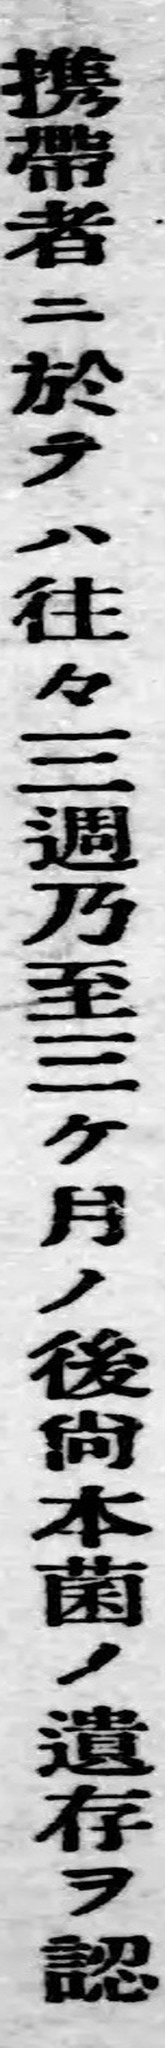携帶者ニ於テハ往々三週乃至三ヶ月ノ後尚本菌ノ遺存ヲ認
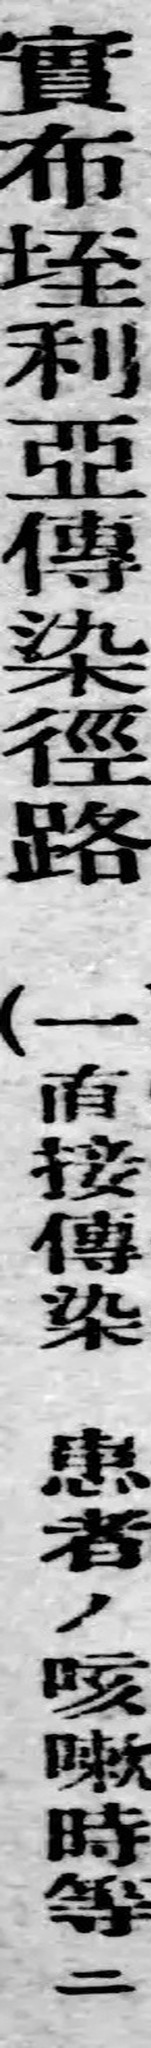實布垤利亞傅染徑路(一)直接傅染患者ノ咳嗽時等ニ

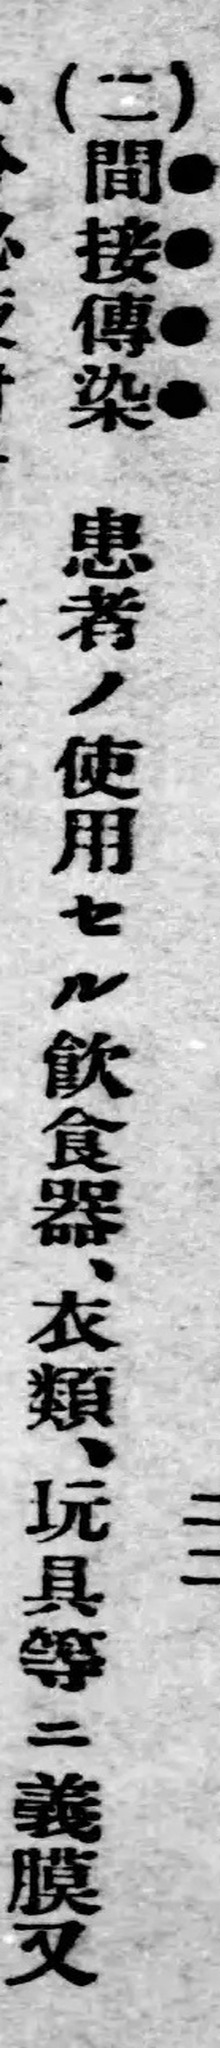(二)間接傅染患者ノ使用セル飮食器、衣類、玩具等ニ義膜又
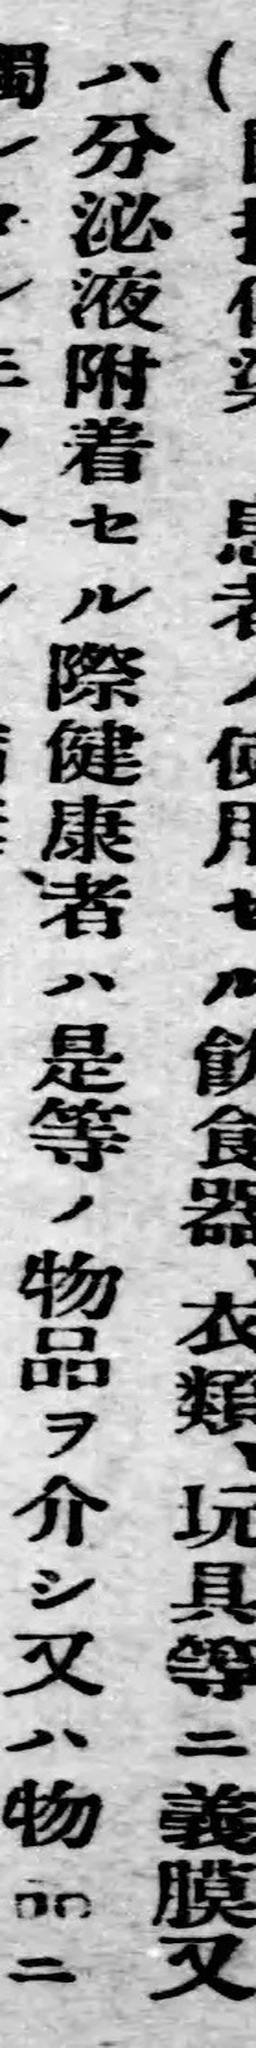ハ分泌液附着セル際健康者ハ是等ノ物品ヲ介シ又ハ物品ニ
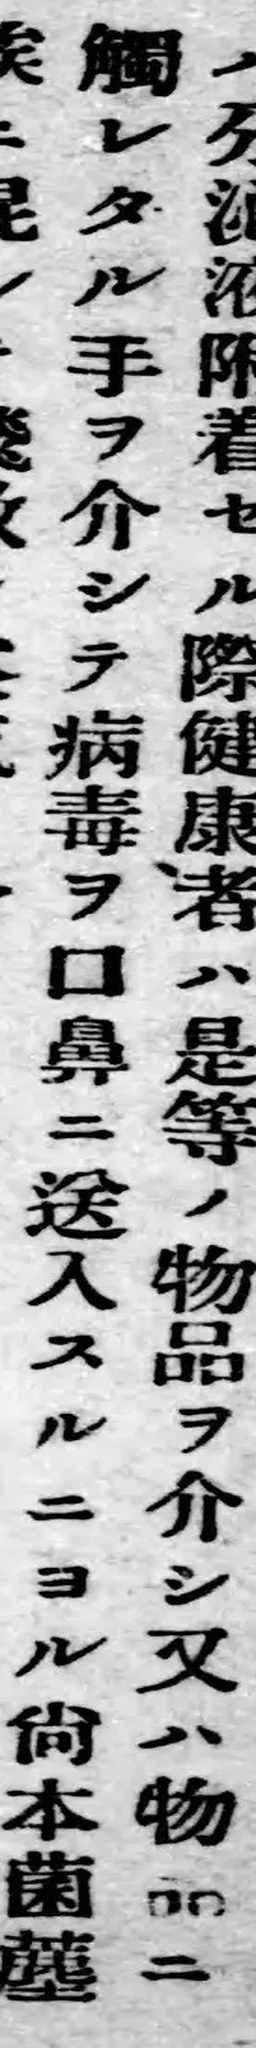觸レタル手ヲ介シテ病毒ヲ口鼻ニ送入スルニヨル尚本菌薼
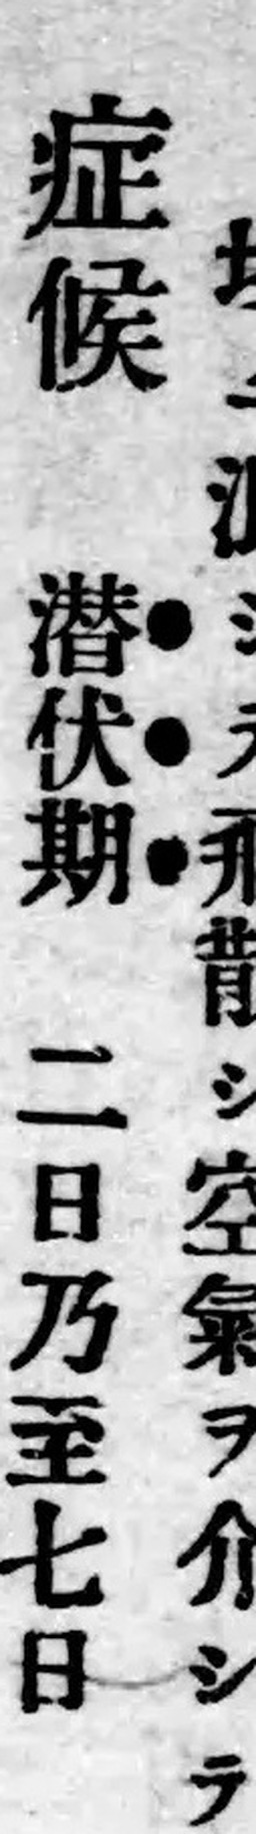症候潜伏期二日乃至七日
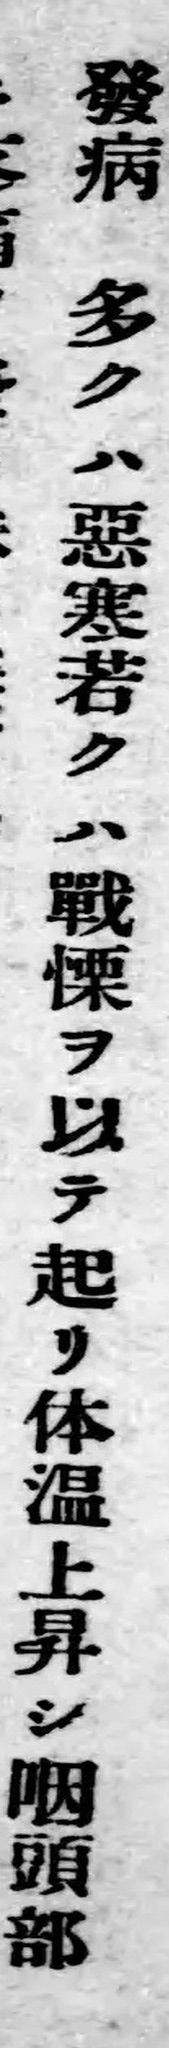發病多クハ惡寒若クハ戰慄ヲ以テ起リ体温上昇シ咽頭部
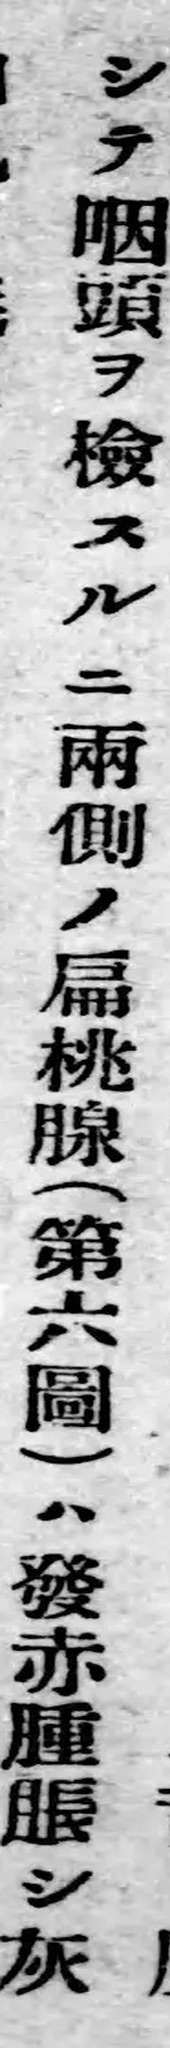シテ咽頭ヲ檢スルニ兩側ノ扁桃腺(第六圖)ハ發赤腫脹シ灰
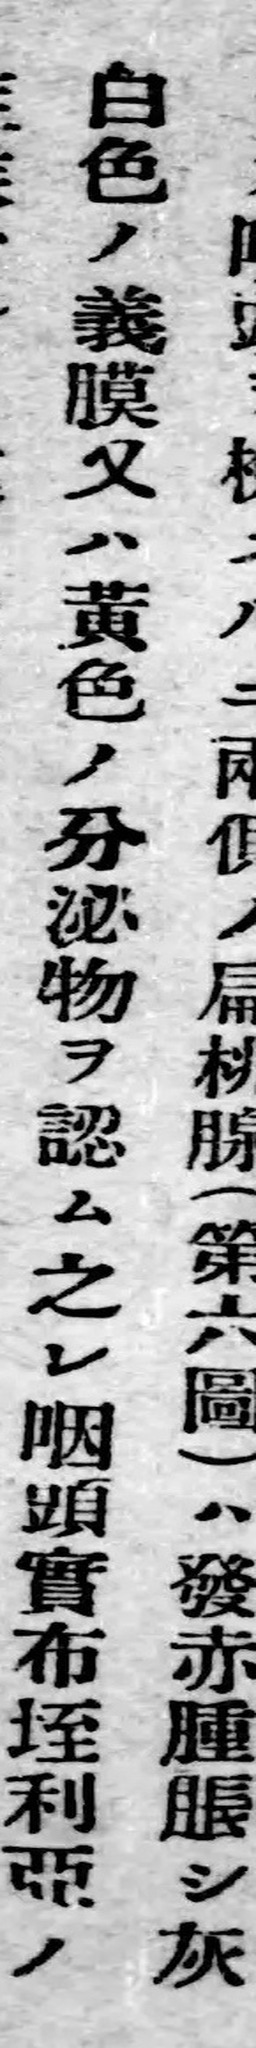白色ノ義膜又ハ黄色ノ分泌物ヲ認ム之レ咽頭實布垤利亞ノ
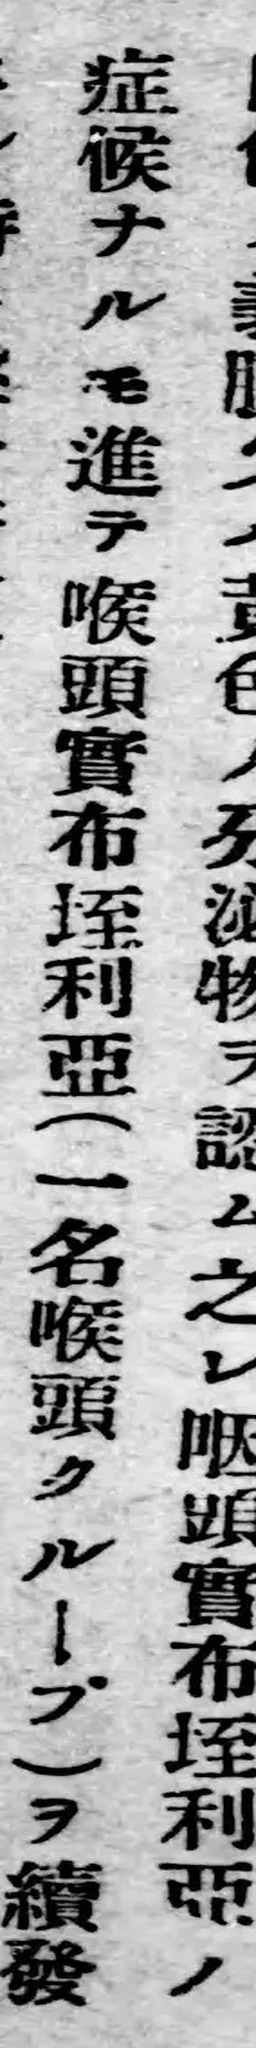症候ナルモ進テ喉頭實布垤利亞(一名喉頭クループ)ヲ續發
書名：袖珍防疫必携
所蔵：国立国会図書館 National Diet Library, JAPAN
